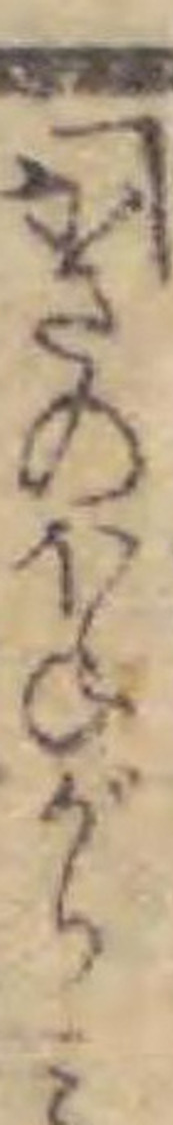〽かさのほねがらみ
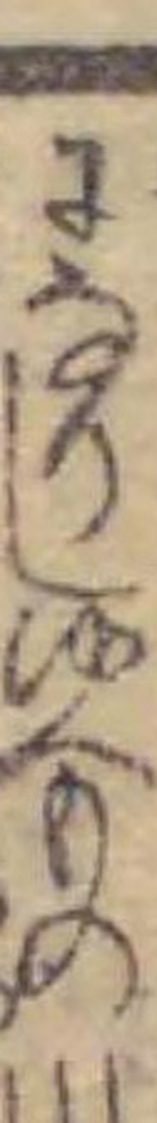になりしゆへもの
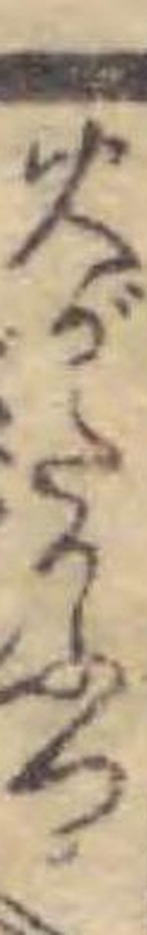火がたかふつ
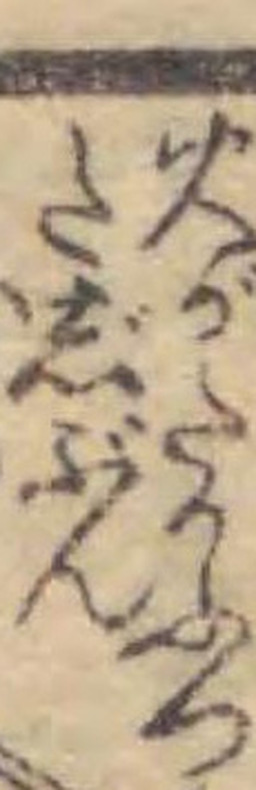たじぶん
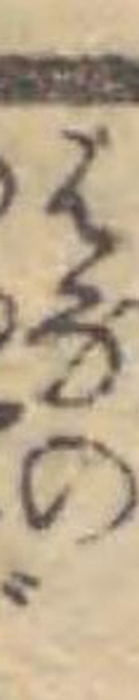はなの
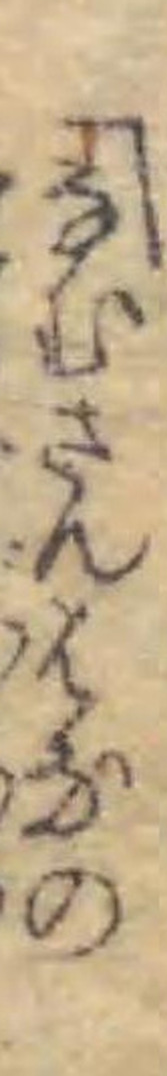〽なむさんはなの
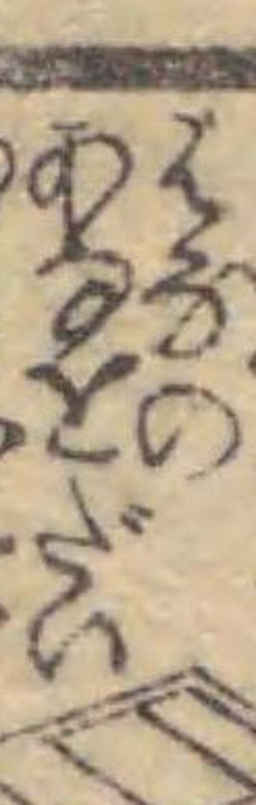あなをだい
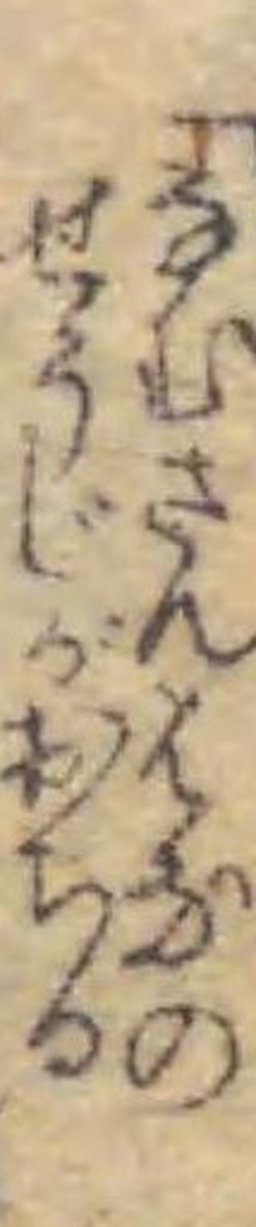せうじがおちる
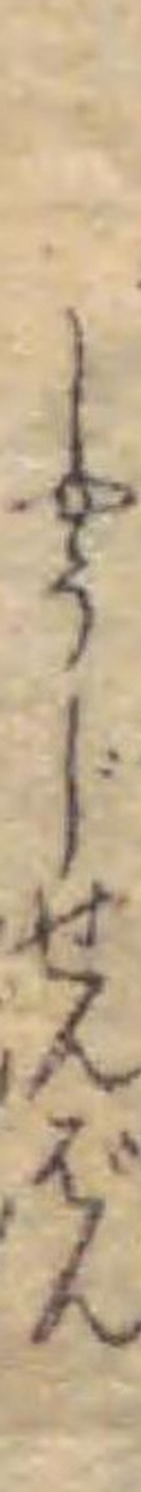しやうじせんばん
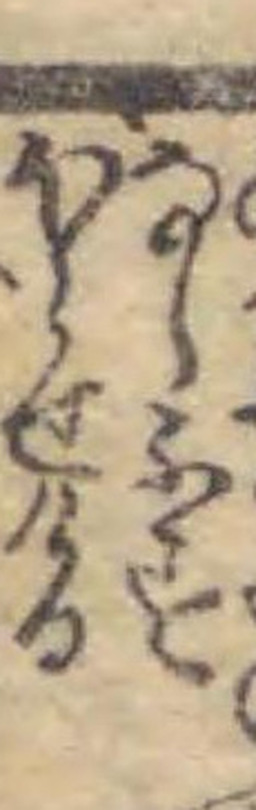ほらせける
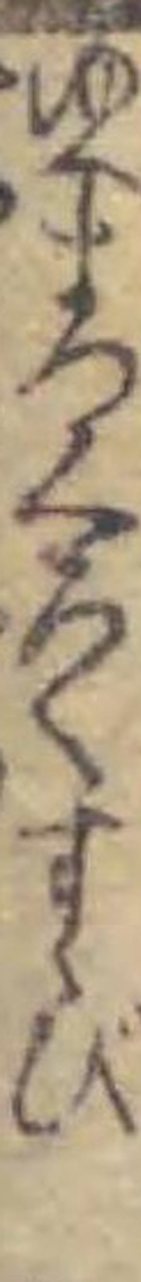ゆへまつくろくすゝび
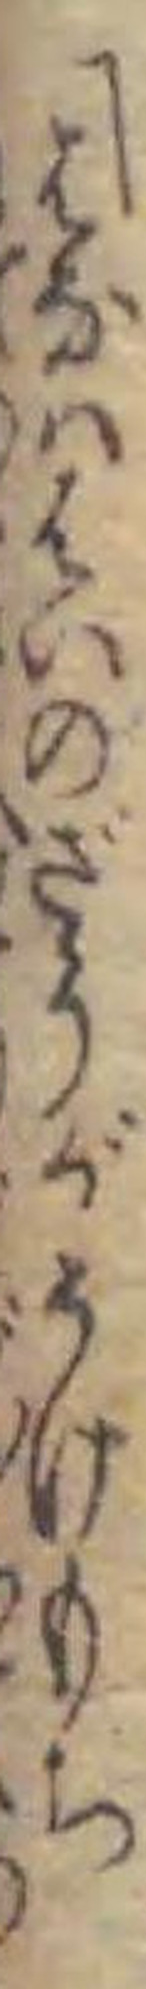〽はなははいのざうがうけもち
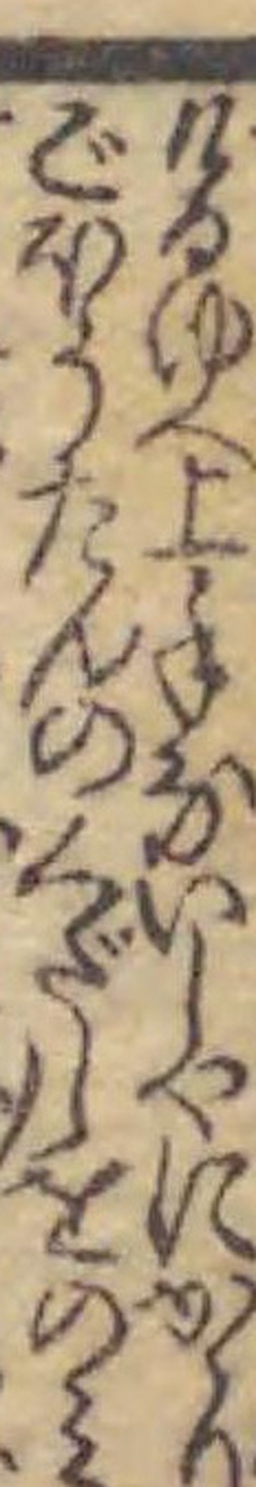ごほうたんのくだしをのみな
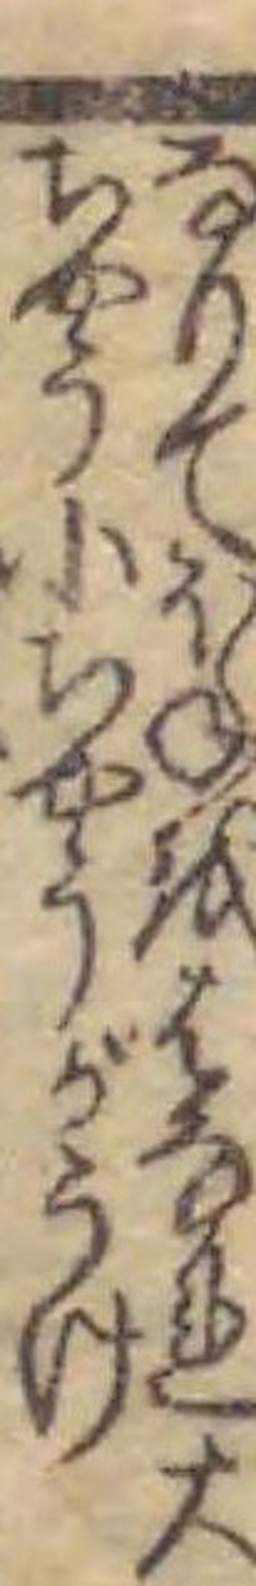ちやう小ちやうがうけ
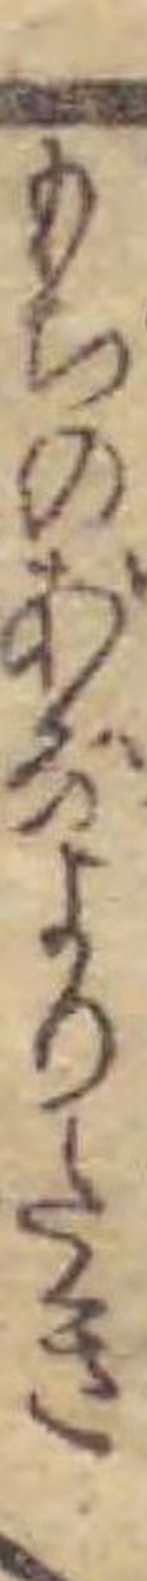もちのあなよりたき
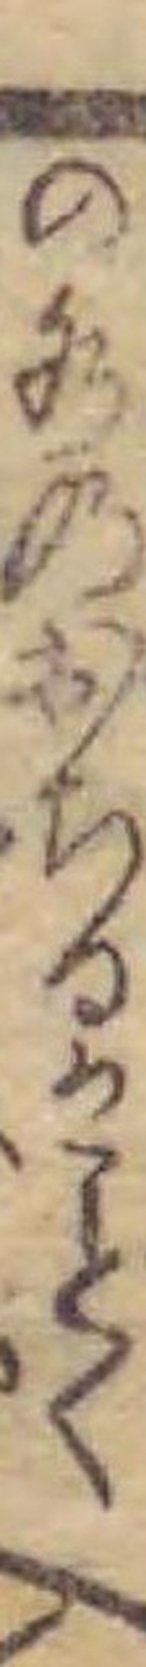の水のおちるかことく
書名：十四傾城腹之内 : 3巻
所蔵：国立国会図書館 National Diet Library, JAPAN
